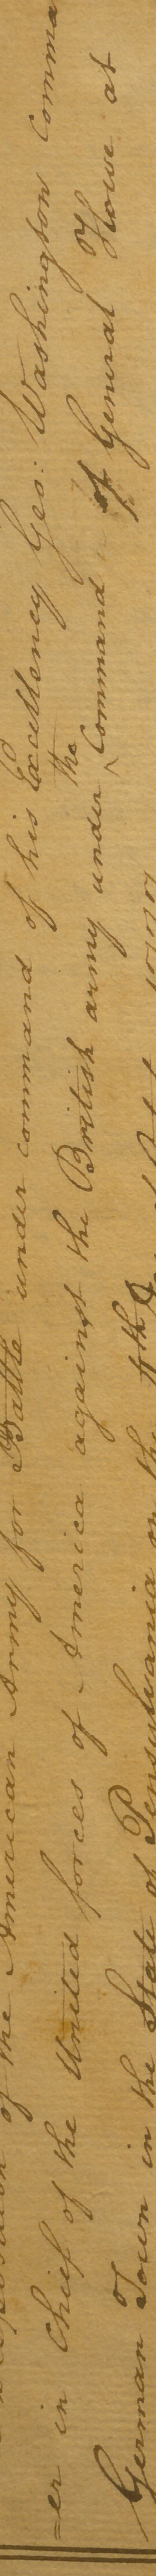-er in Chief of the United forces of America against the British army under ^the Command of General Howe at
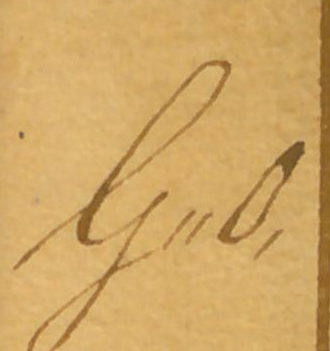G.O.
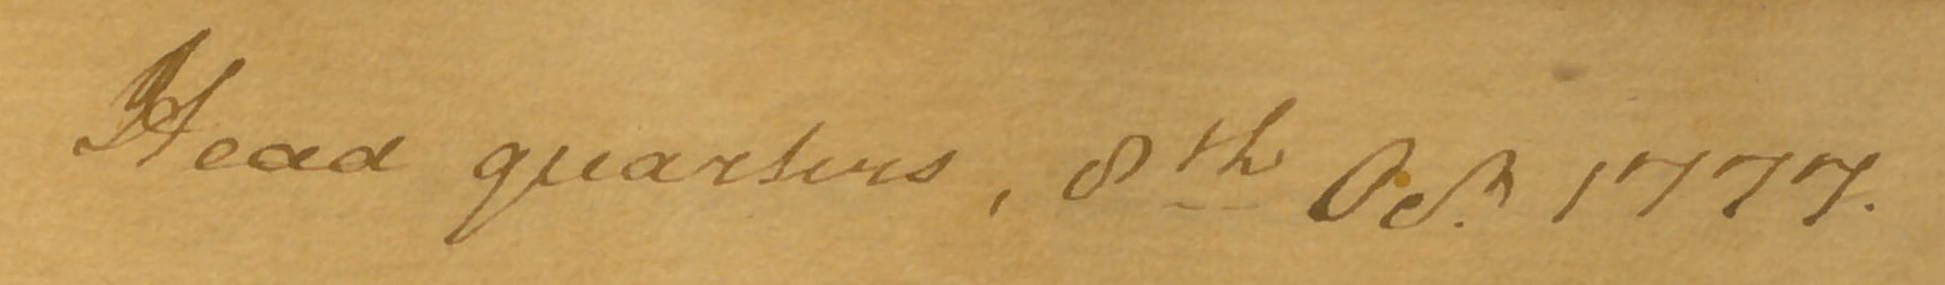Head quarters, 8^th Oc^r. 1777.
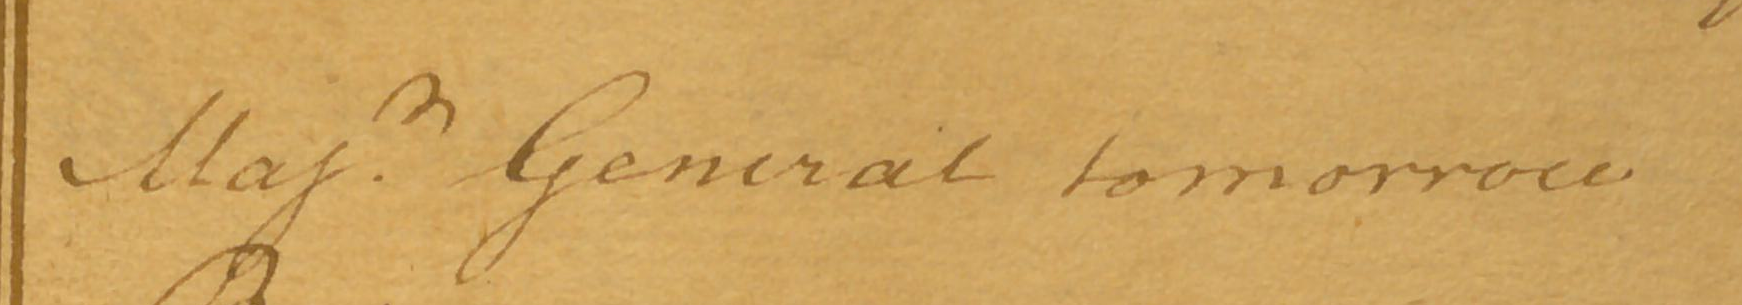Maj^r. General tomorrow
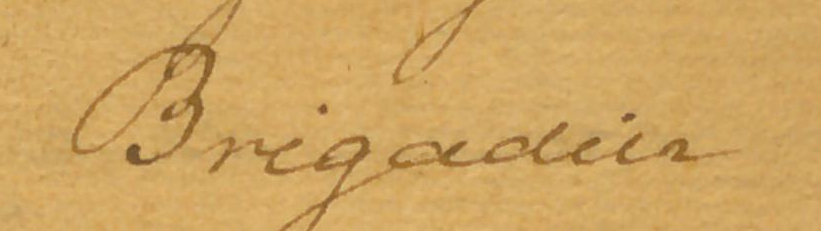Brigadier
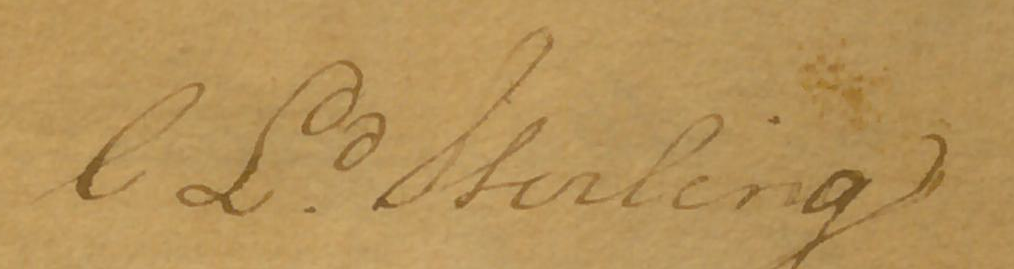C L^d. Sterling
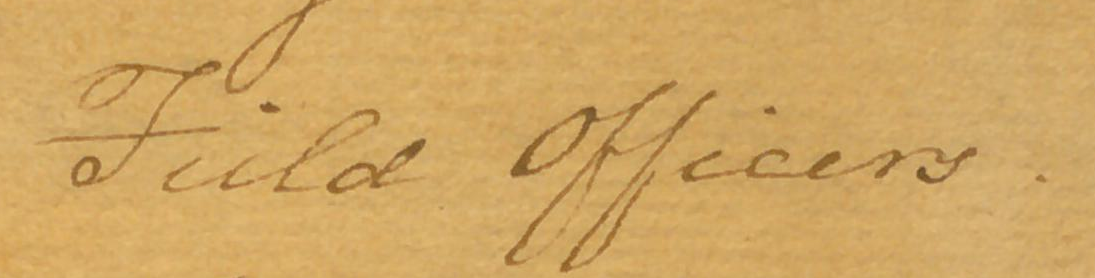Field officers
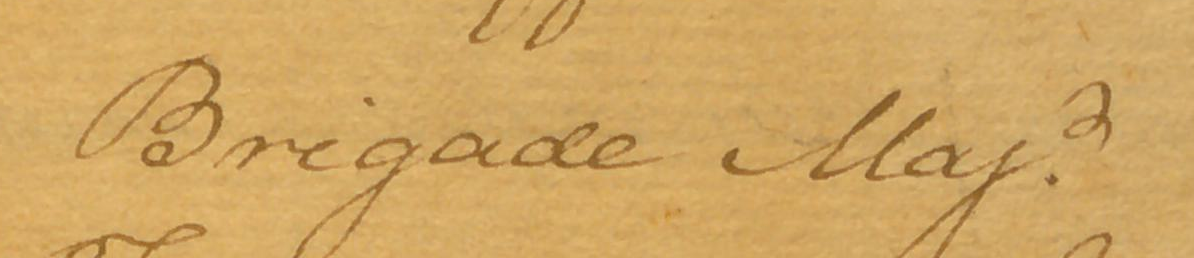Brigade Maj^r.
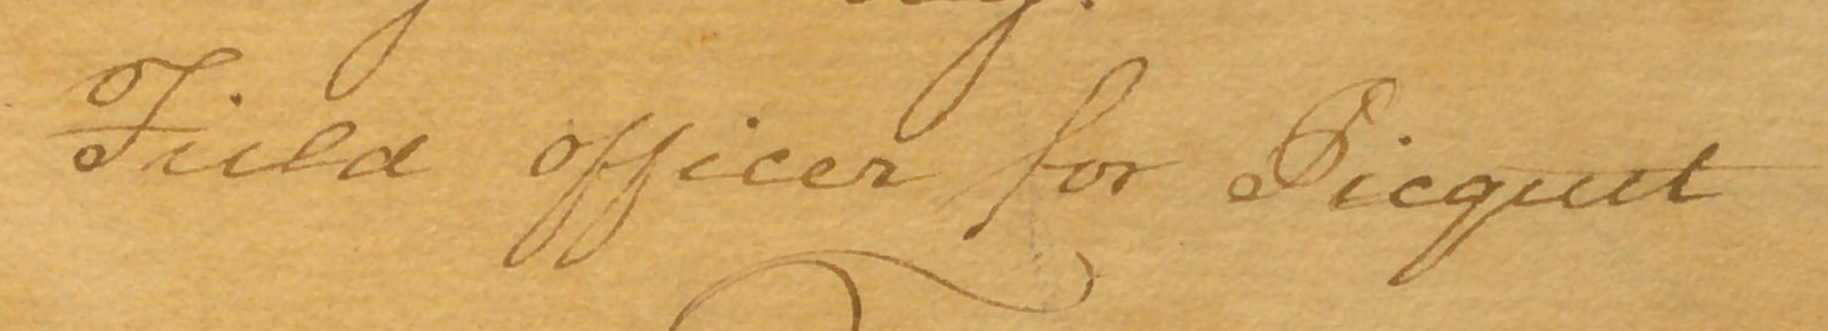Field officer for Picquet
